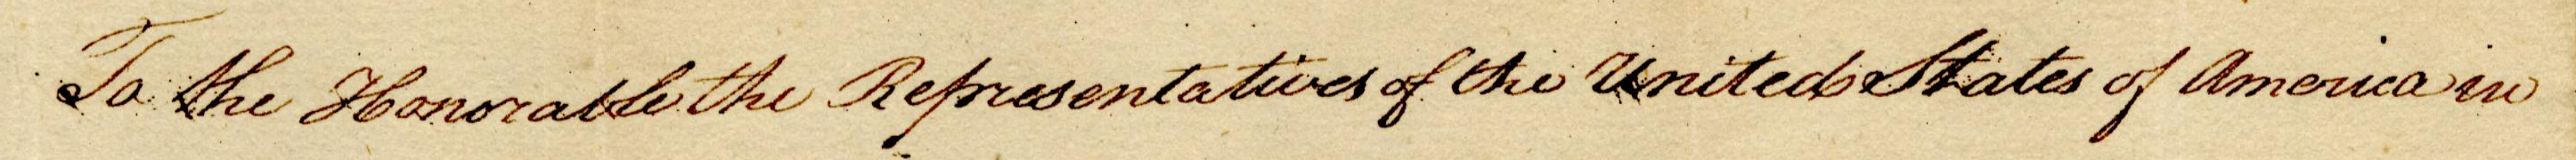To the Honorable the Representatives of the United States of America in
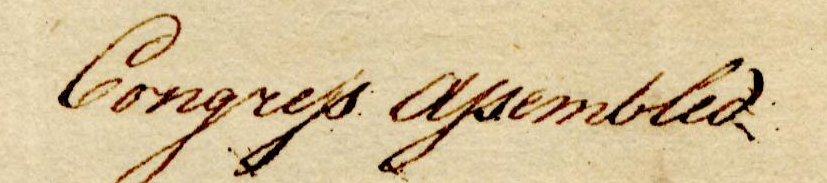Congress assembled
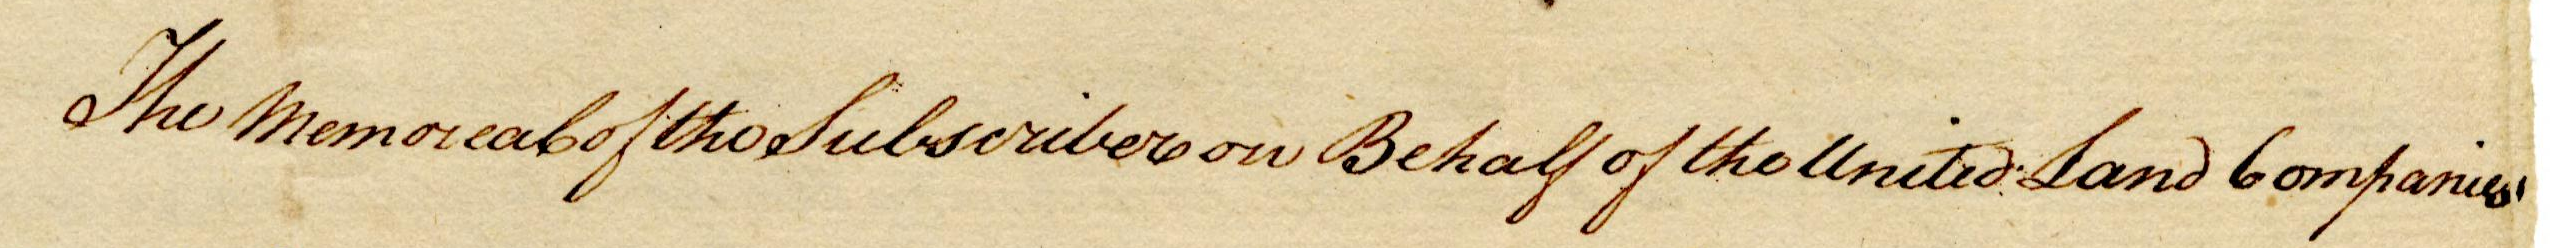The Memoreal of the Subscribers on Behalf of the United Land Companies
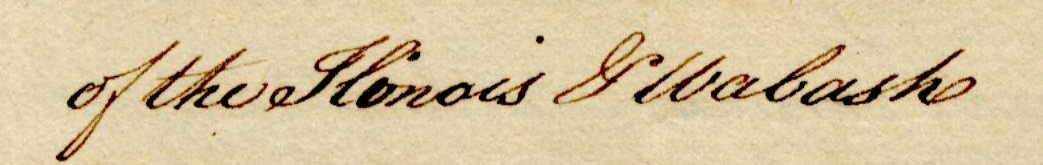of the Illinois & Wabash
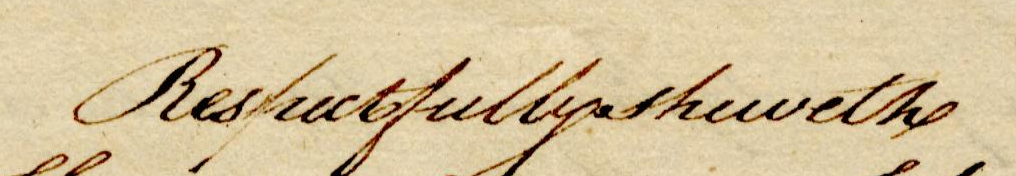Respectfully sheweth
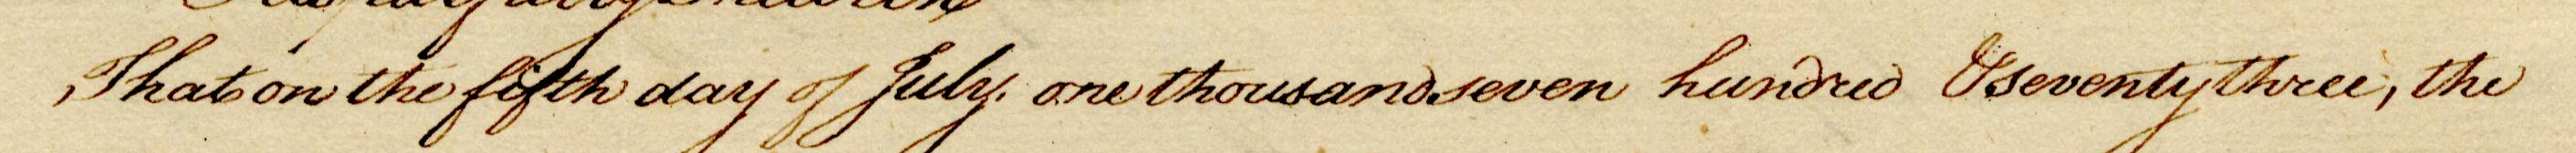That on the fifth day of July one thousand seven hundred & seventy three, the
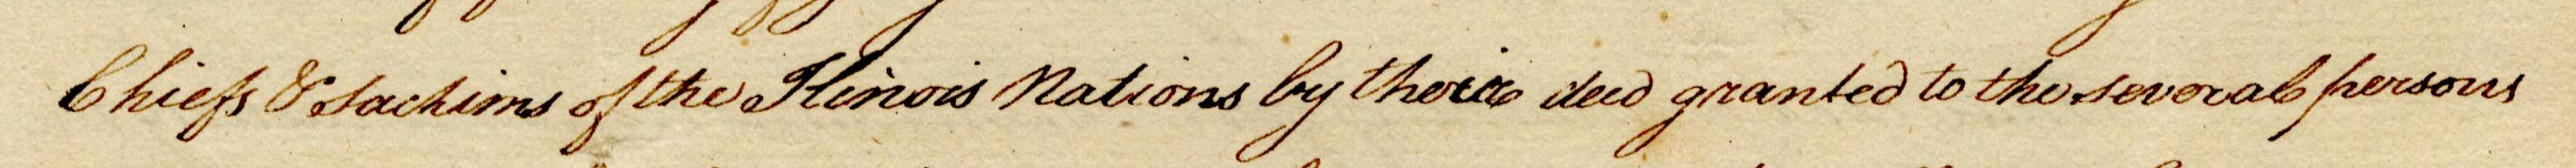Chiefs & Sachims of the Illinois Nations by their deed granted to the several persons
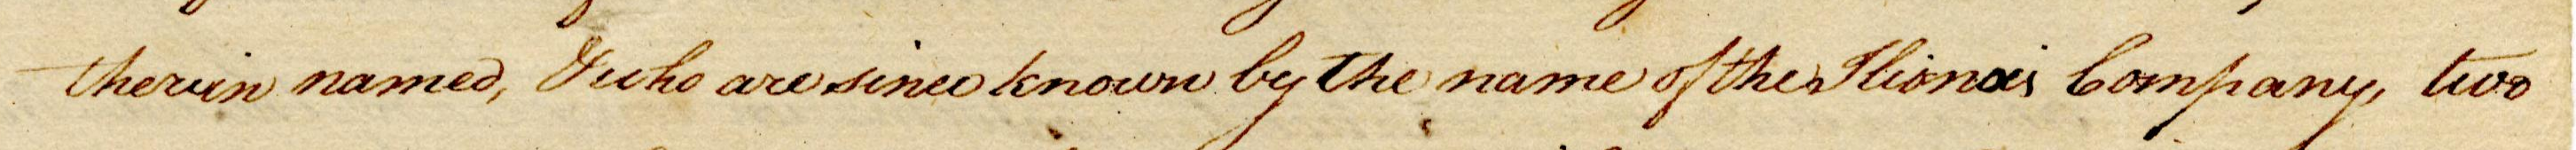therein named, & who are since known by the name of the Ilinois Company two
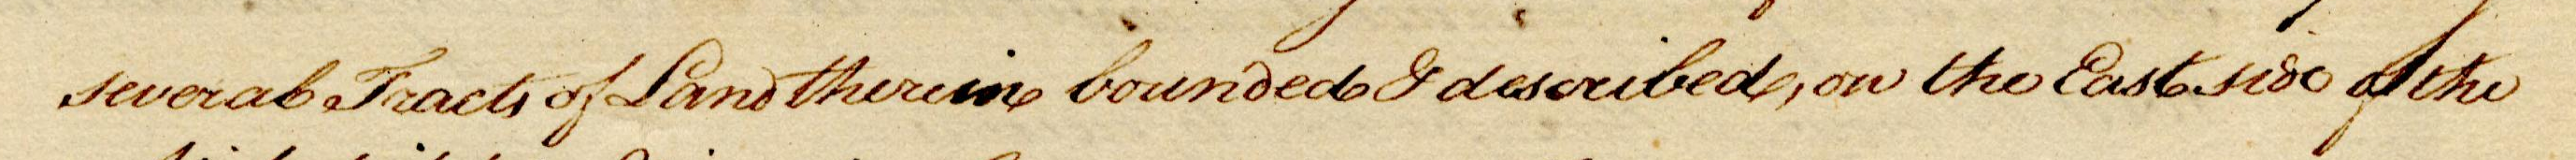several tracts of Land therein bounded I described, on the East side of the
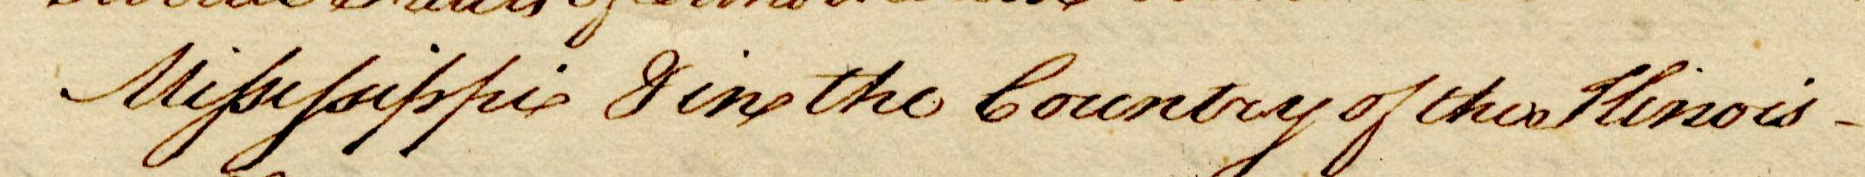Mississippi & in the Country of the Ilinois
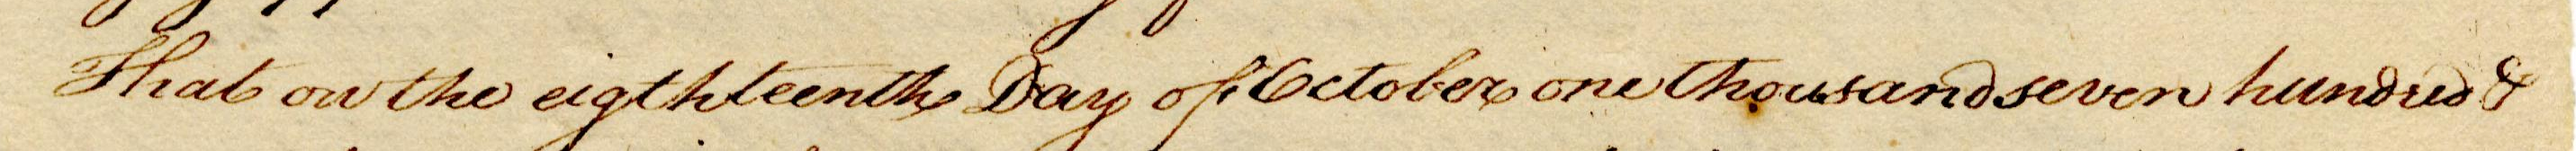That on the eighteenth Day of October one thousand seven hundred &
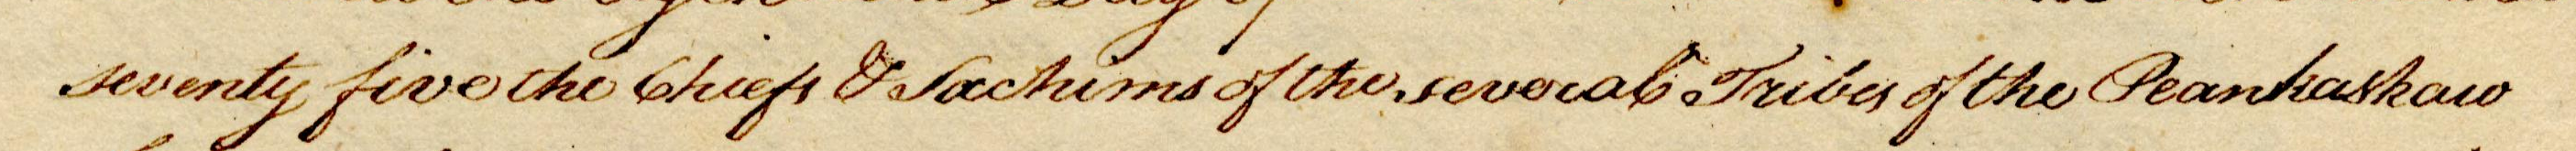seventy five the Chiefs & sachims of the several Tribes of the Peankashaw
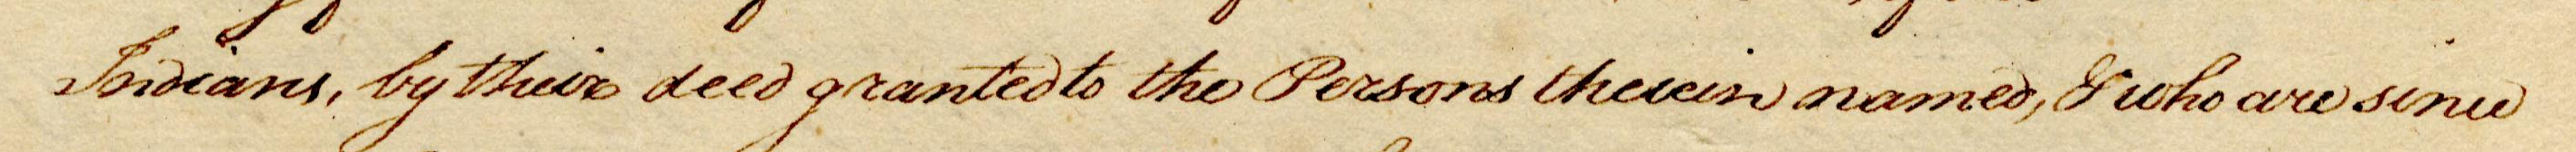Indians, by their deed granted to the Persons therein named, & who are since
